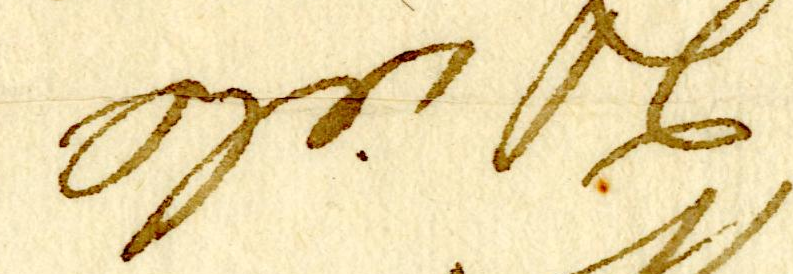Y^rs. &c
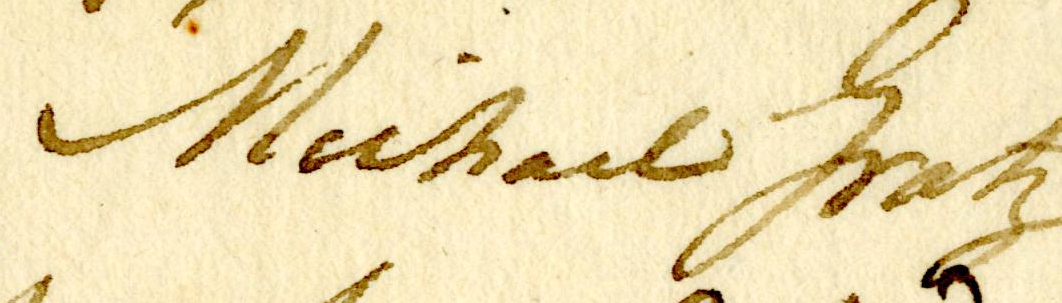Michael Gratz
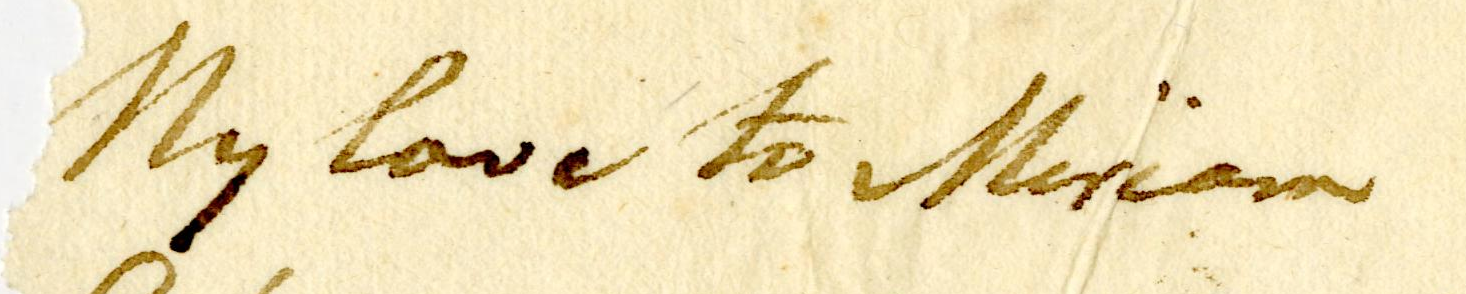My love to Miriam
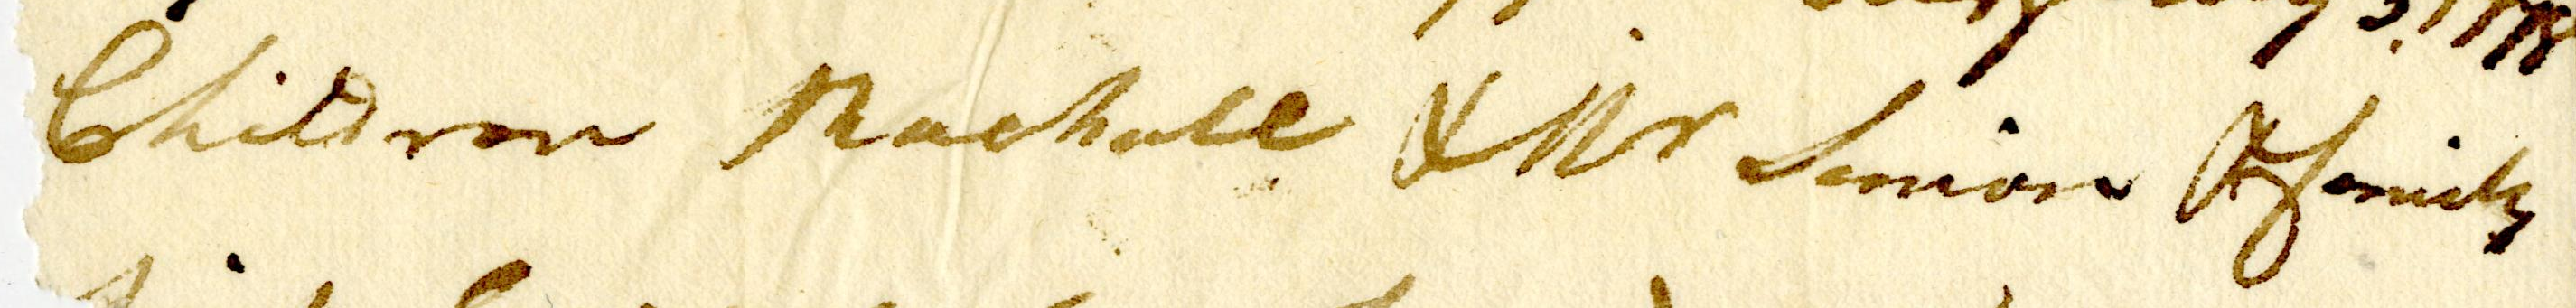Children Rachale & M^r Simon & family
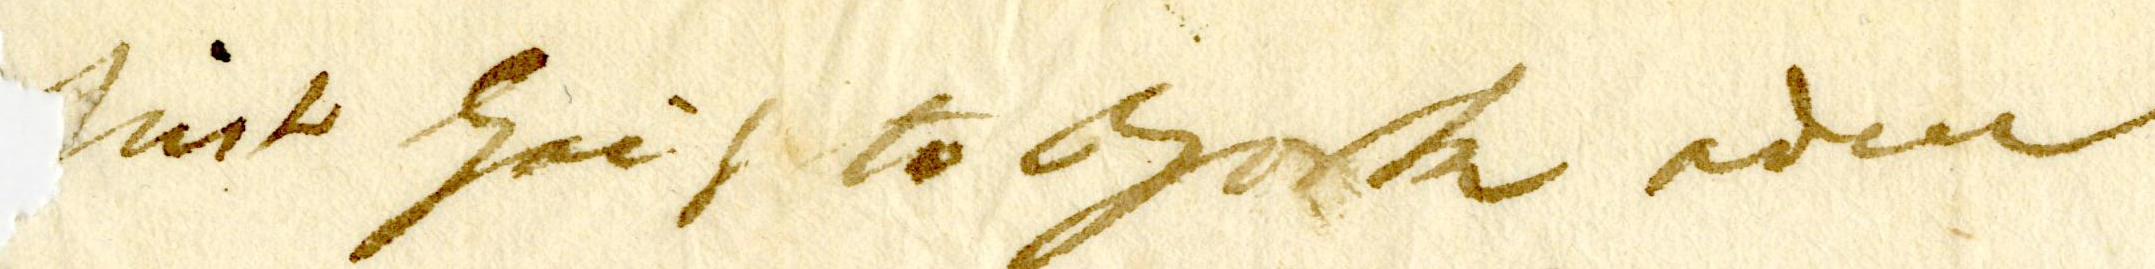Just sail to York adeu
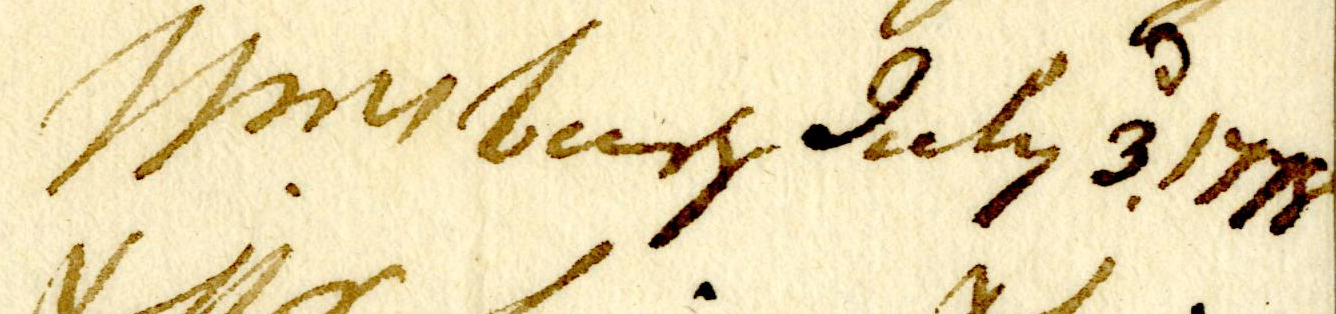W^msburg July 3^d 1778
